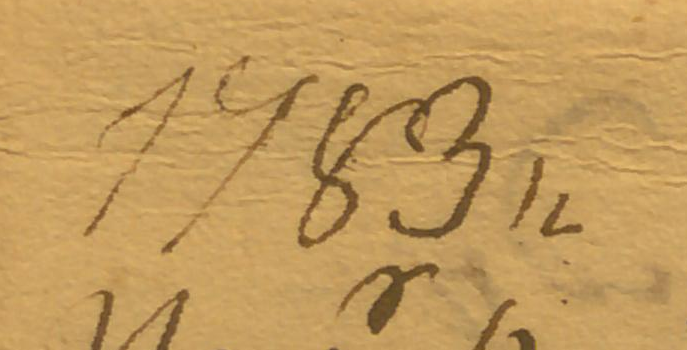1783
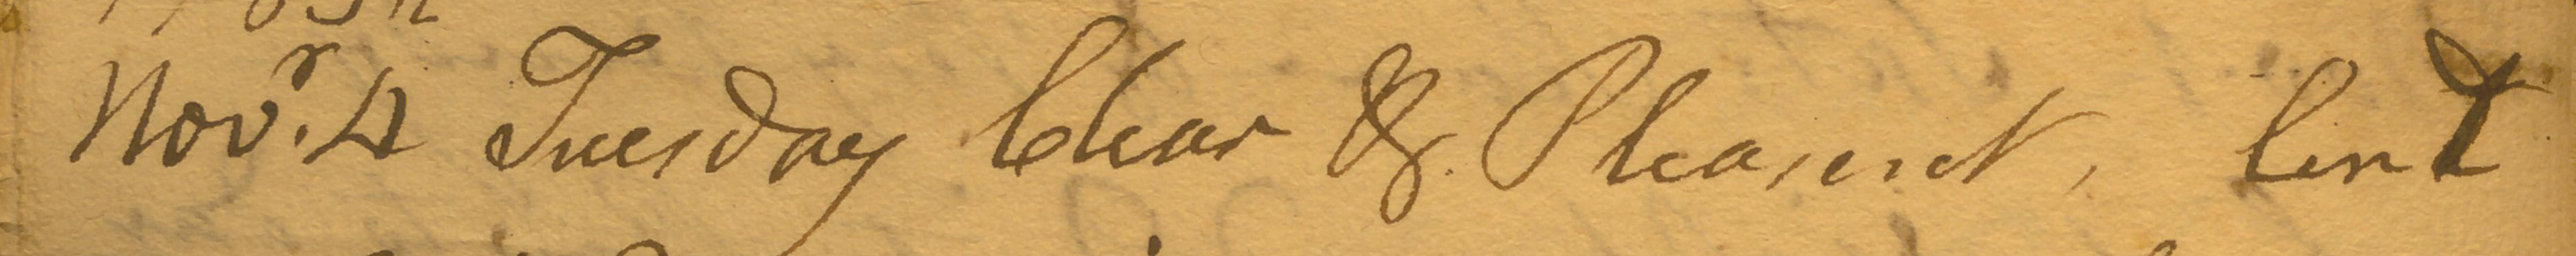Nov^r. 4 Tuesday Clear & Pleaseet. lent
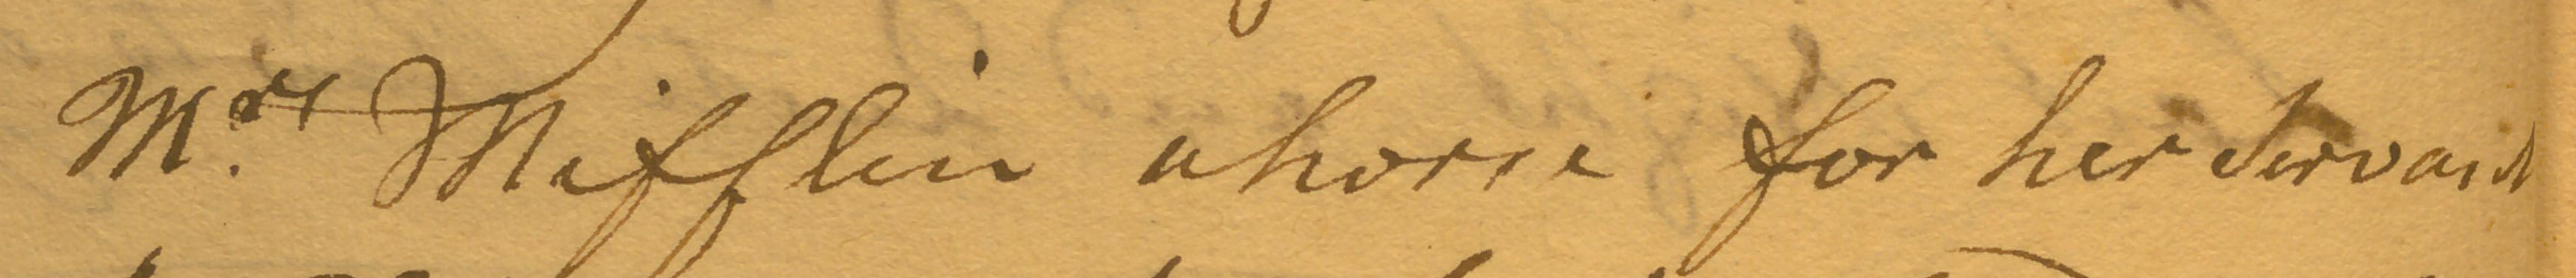M^rs. Mifflin a horse for her Servant
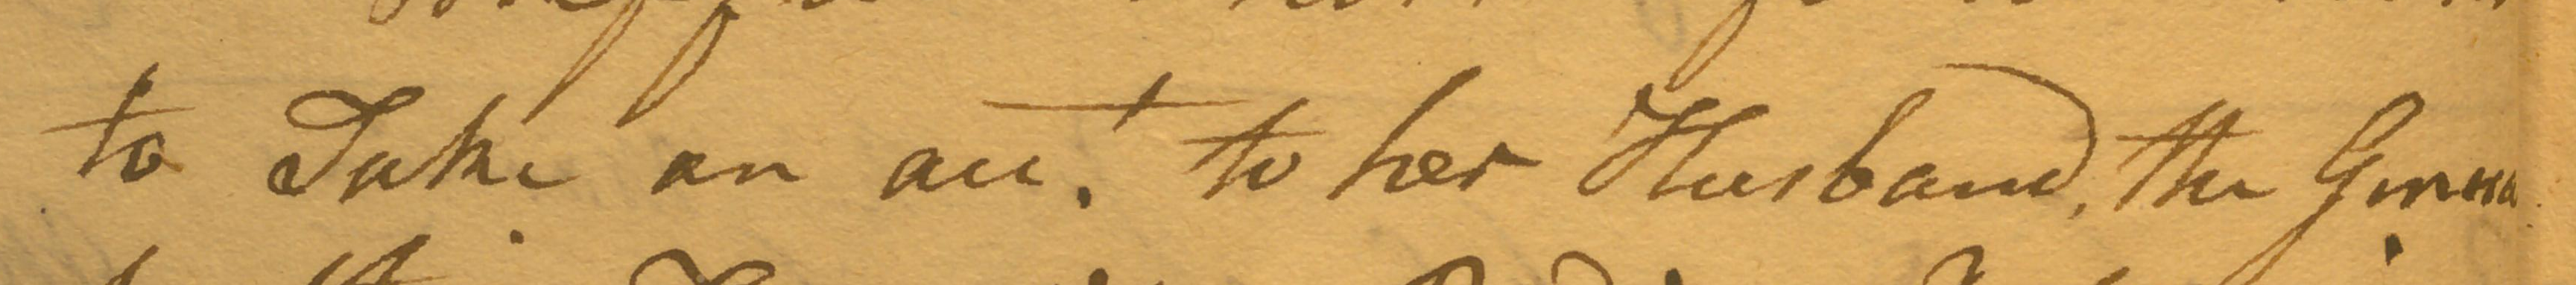to Take an acc^t. to her Husband the General
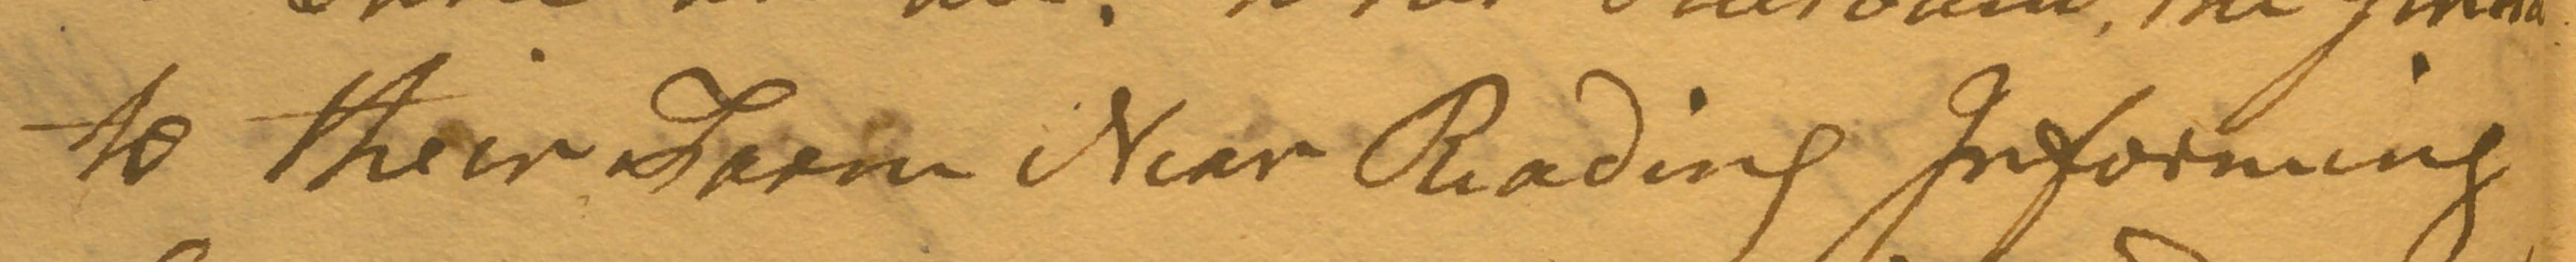to their Farm Near Reading Informing
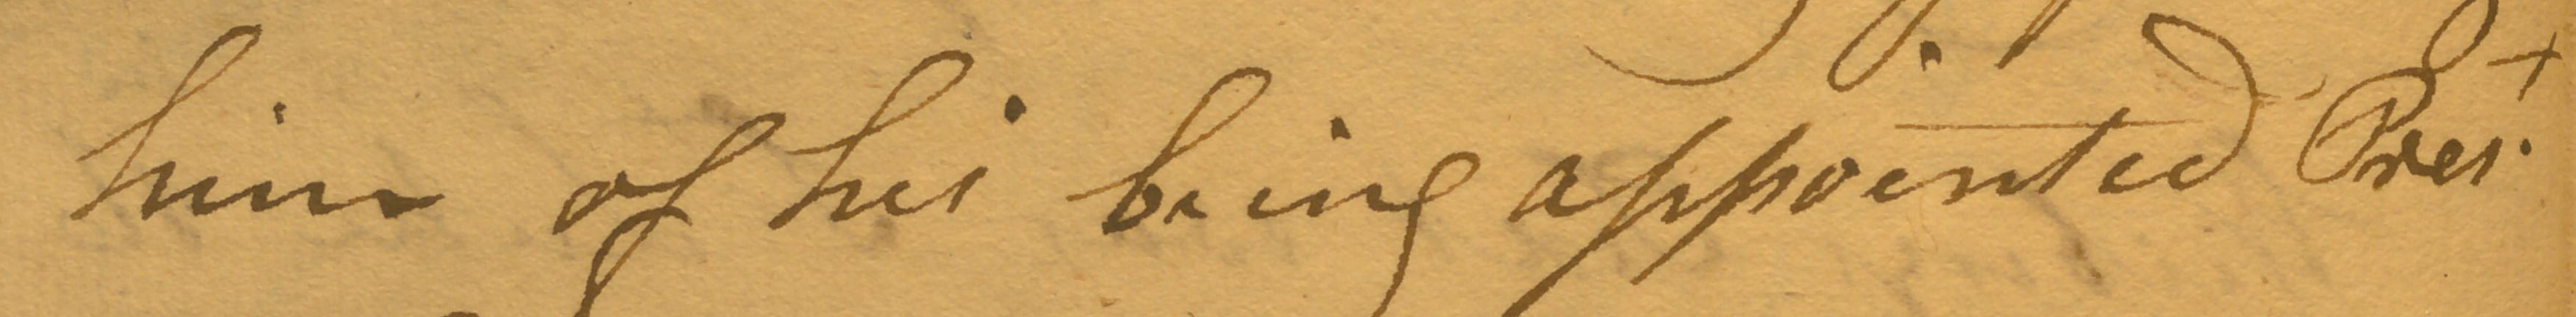tm of his being appointed Pres^t.
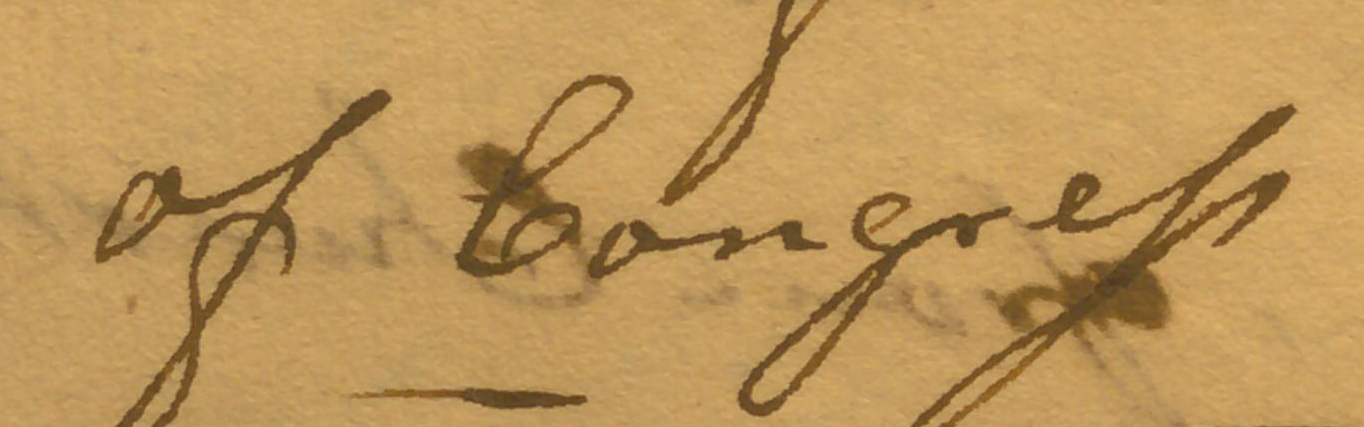of Congress
